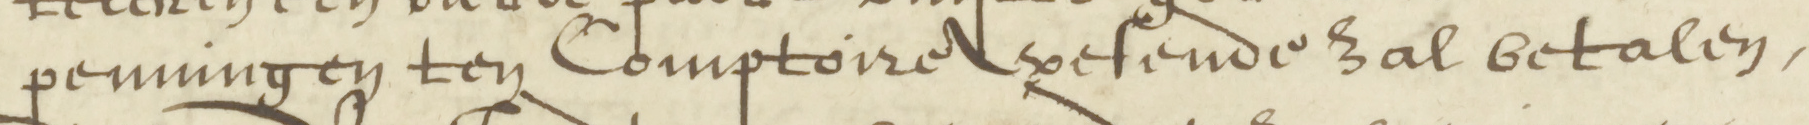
penningen ten Comptoire wesende zal betalen,
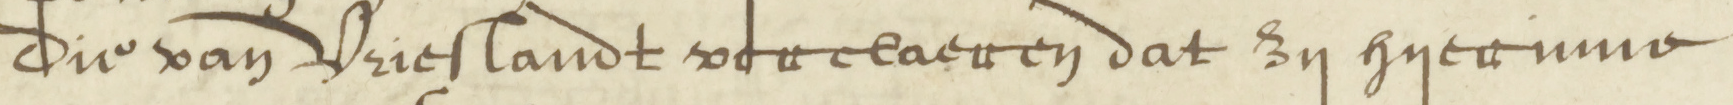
die van Vrieslandt verclaeren dat zy hyerinne
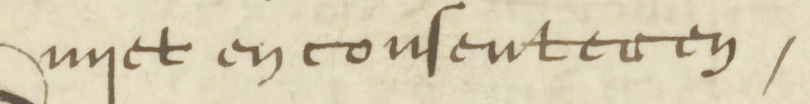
nyet en consenteren.
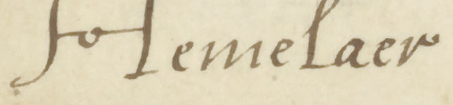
Hemelaer
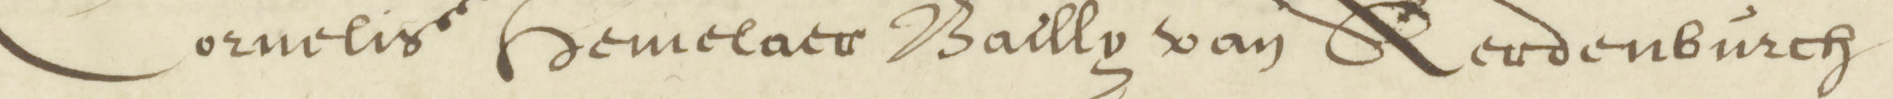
Cornelis Hemelaer Bailly van Aerdenburch
